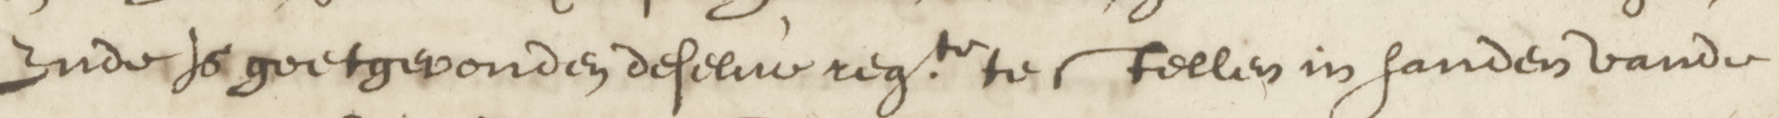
Ende Is goetgevonden deselu reqte. te stellen in handen vande
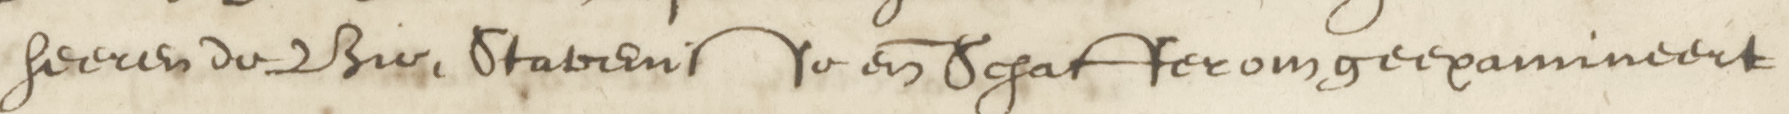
heeren de Bie, Stavenisse en Schaffer om geexamineert
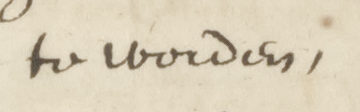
te worden.
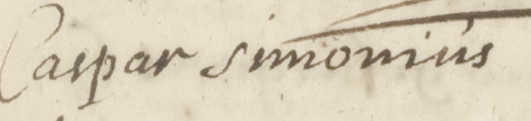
Caspar simonius
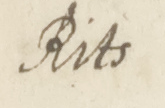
Rits
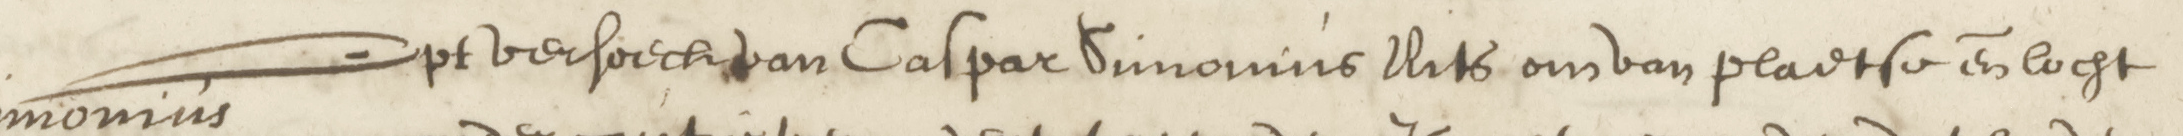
Opt versoeck van Caspar Simonius Rits om van plaetse en locht
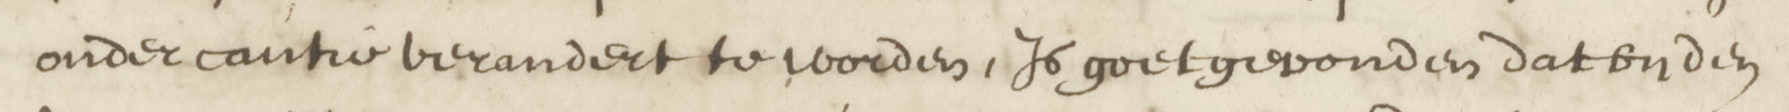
onder cautie verandert te worden, Is goetgevonden dat by den
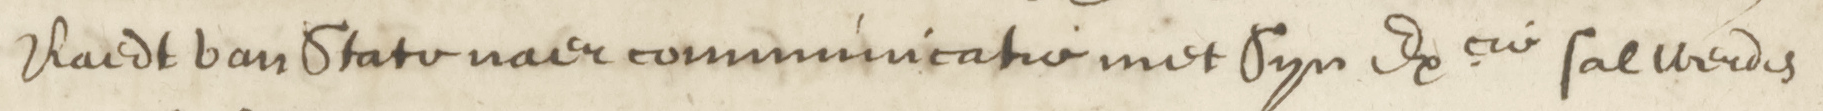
Raedt van State naer communicatie met Syn Excie. sal werden
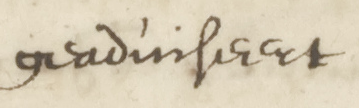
geaduiseert
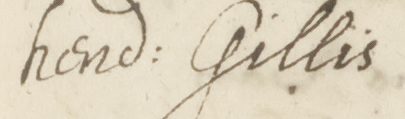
hend: Gillis
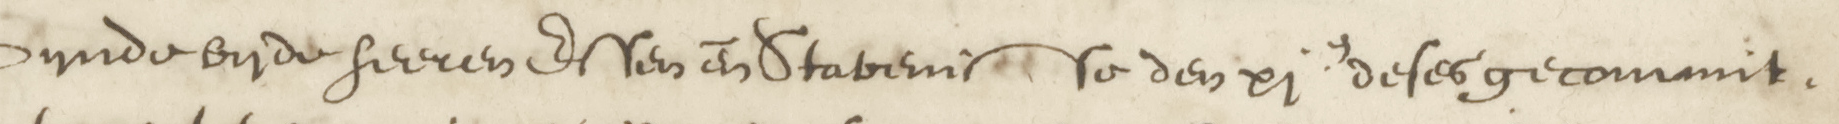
Synde byde heeren Essen en Stavenissse den xie. deses gecommit„
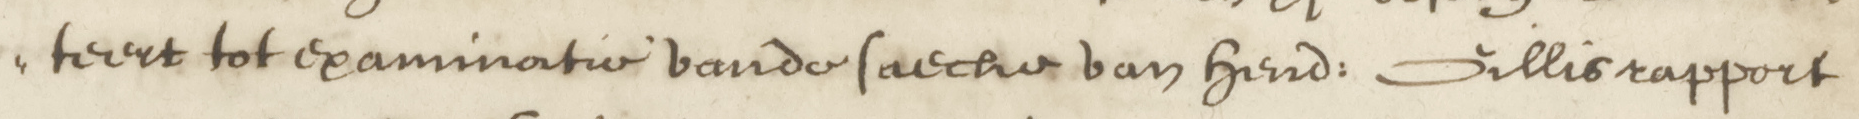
,,teert tot examinatie vande saecke van hend: Gillis rapport
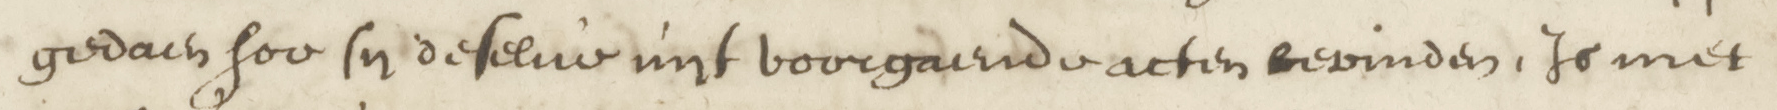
gedaen soe sy deselue uyt voorgaende acten bevinden, Is met
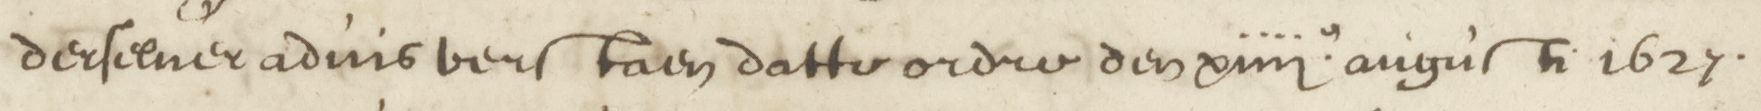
derseluer aduis verstaen datte ordre den xiiije. augusti 1627.
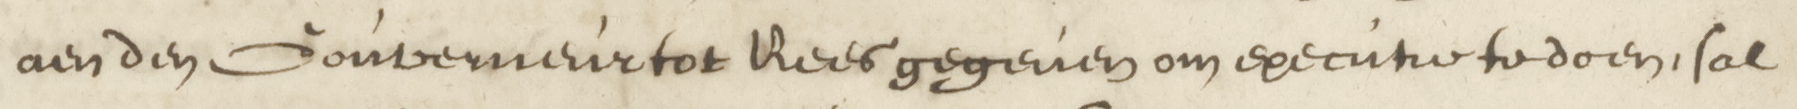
aen den Gouverneur tot Rees gegeuen om executie te doen, sal
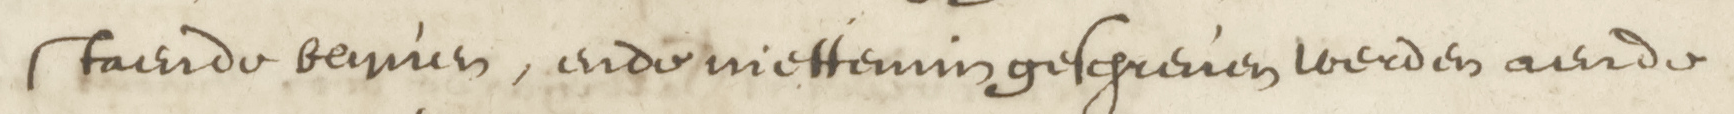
staende blyuen, ende niettemin geschreuen werden aende
